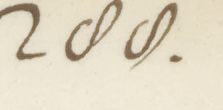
288.
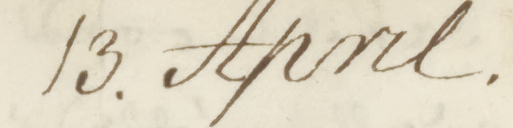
13. April.
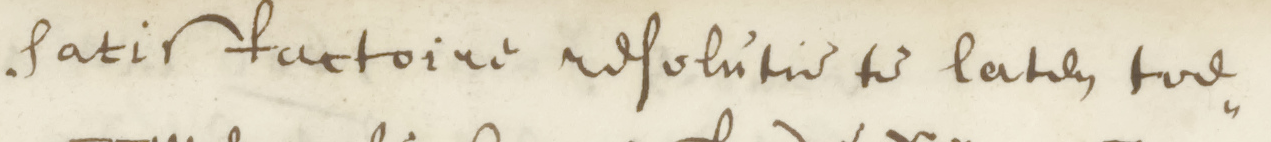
satisfactoire resolutie te laten toe„
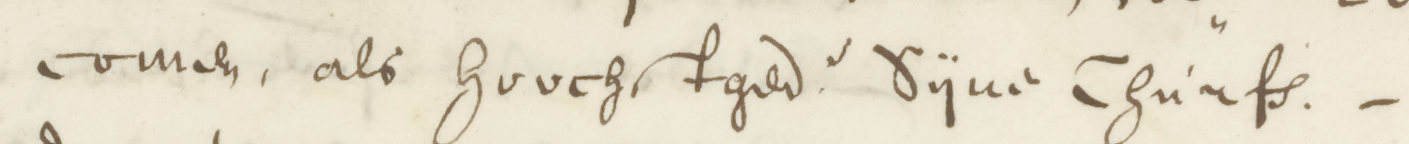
comen, als hoochstgede Sijne Churf.-
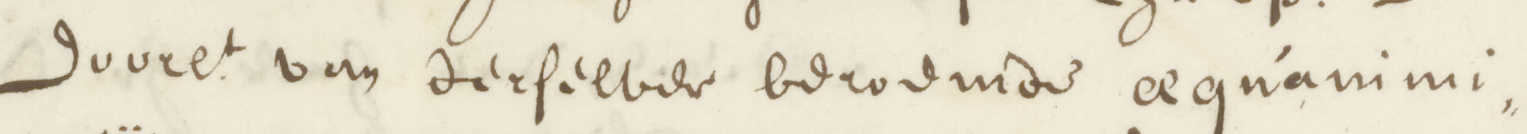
Doorlt. van derselver beroemde æquanimi„
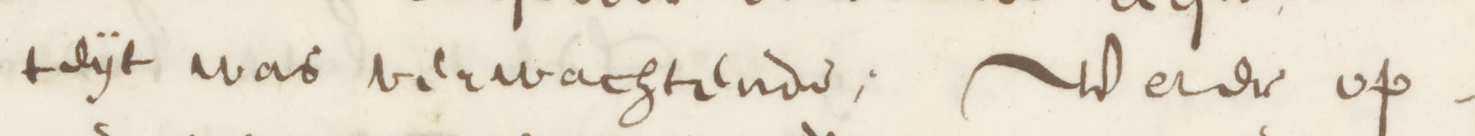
teijt was verwachtende; Waer op
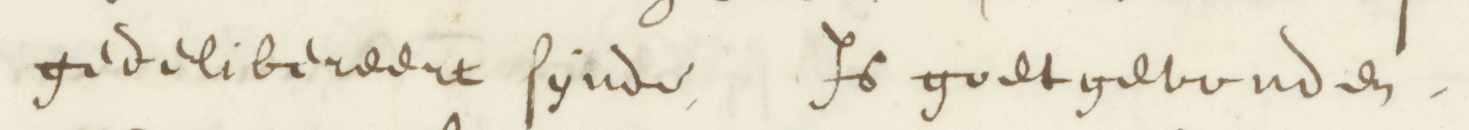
gedelibereert sijnde, Is goetgevonden
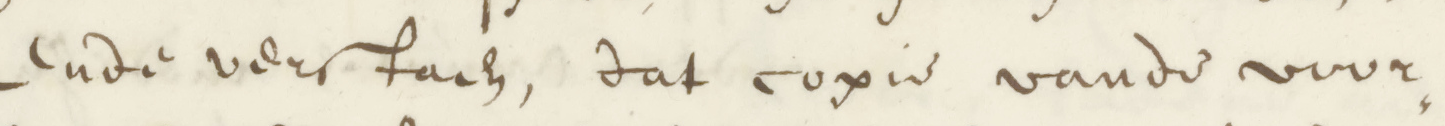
ende verstaen, dat copie vande voor„
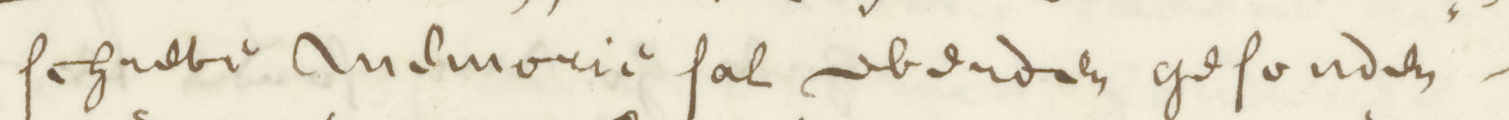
schreve memorie sal werden gesonden
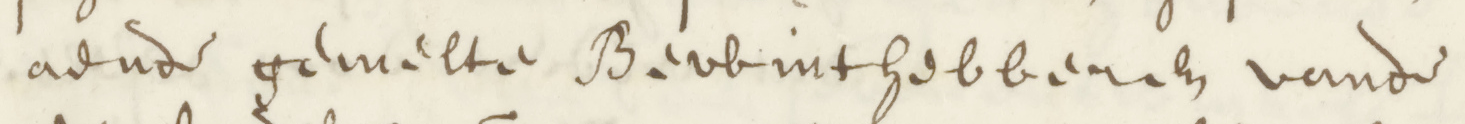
aende gemelte Bewinthebberen vande
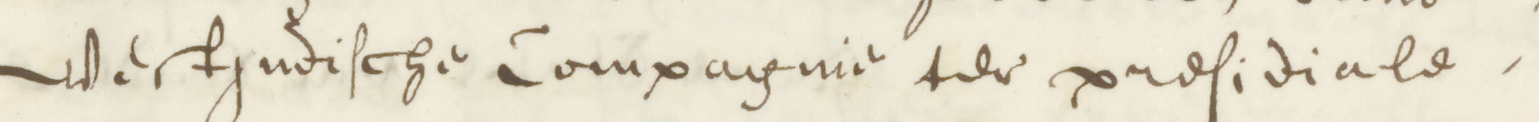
Westindische Compagnie ter presidiale
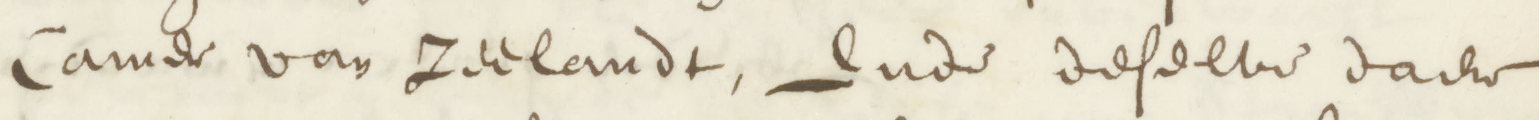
Camer van Zeelandt, Ende deselve daer
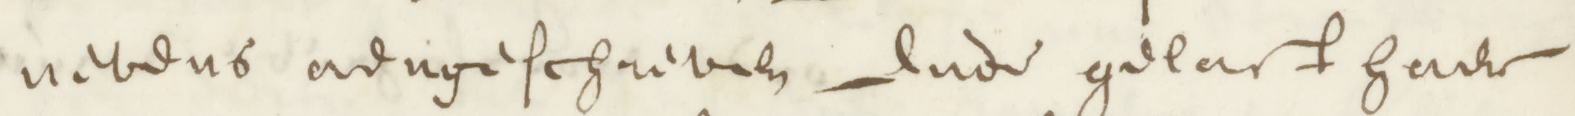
nevens aengeschreven ende gelast haer
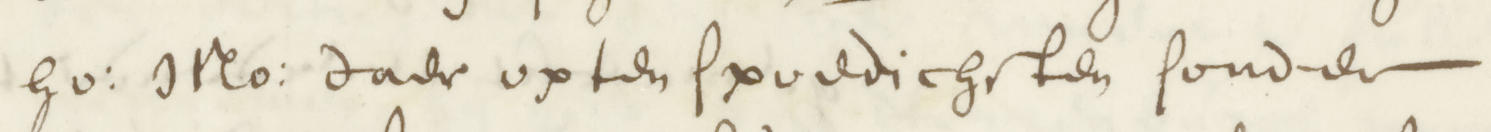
ho:Mo: daer opten spoedichsten sonder
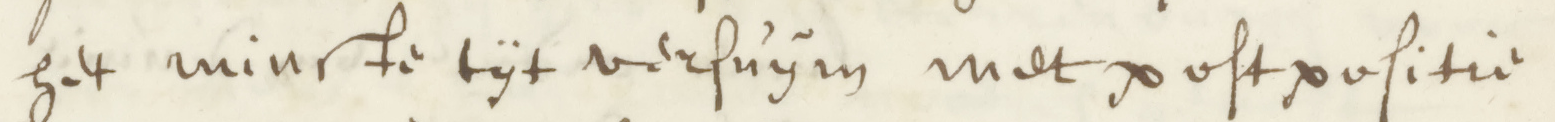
het minste tijt versuijm met postpositie
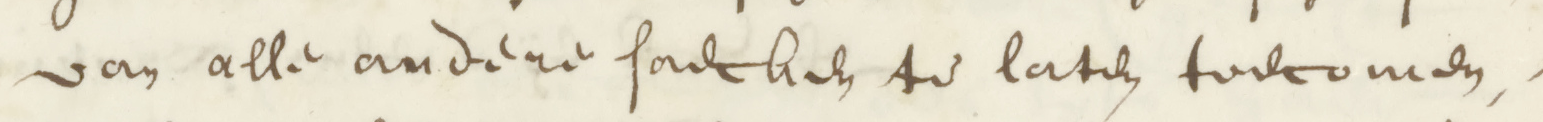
van alle andere saecken te laten toecomen,
